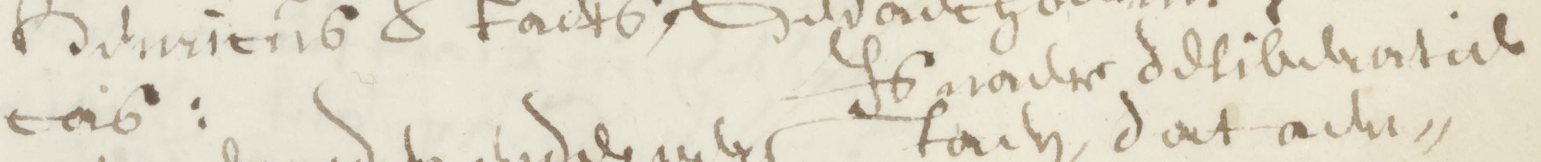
cas: Is naer deliberatie
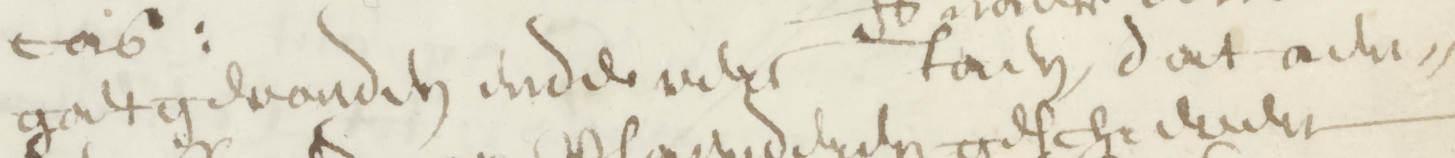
goetgevonden ende verstaen, dat aen„
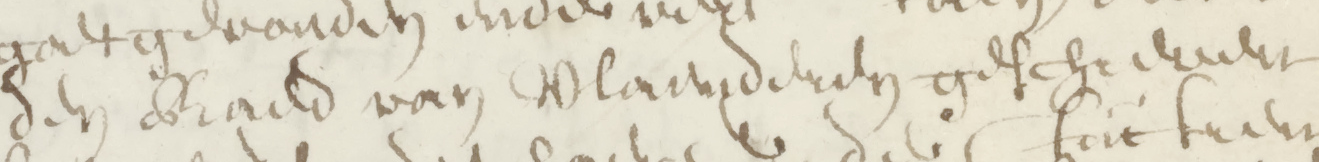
den Raed van Vlaenderen geschreven
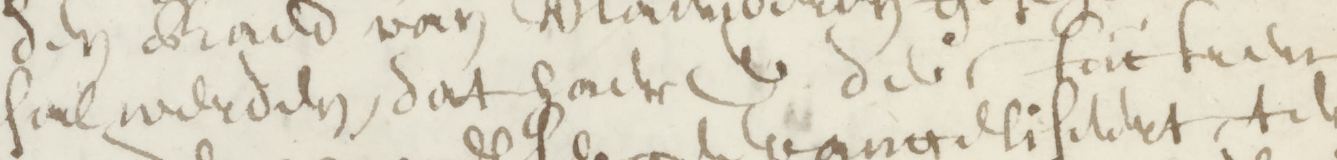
sal werden, dat haer E de stucken
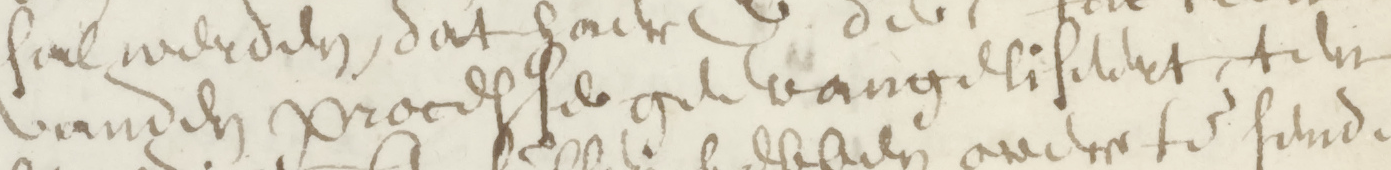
vanden processe geevangeliseert, ten
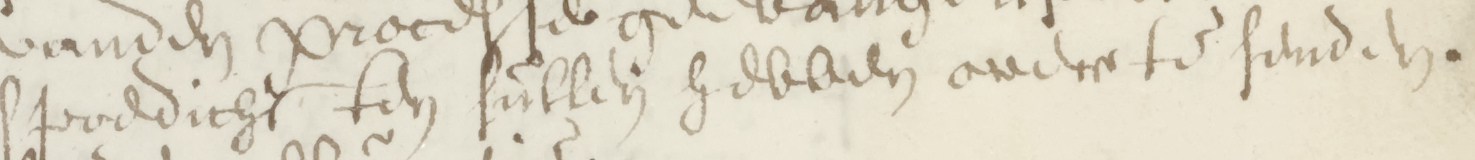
spoedichsten sullen hebben over te senden,
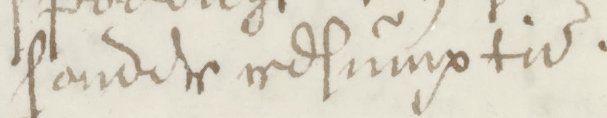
sonder resumptie.
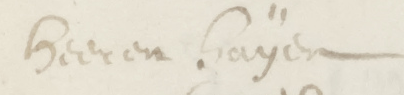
heeren haijen
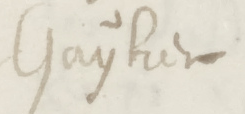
Gaijken
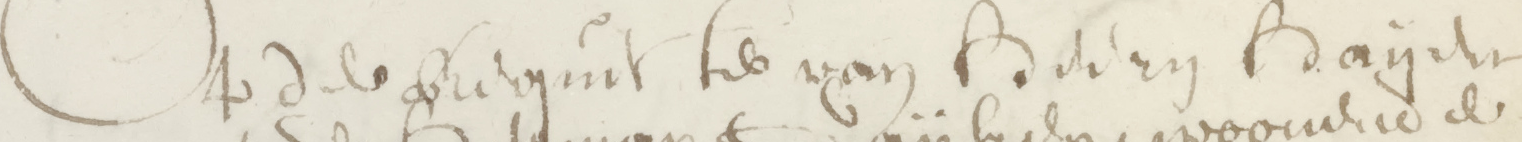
Opde Requeste van Heern Haijen
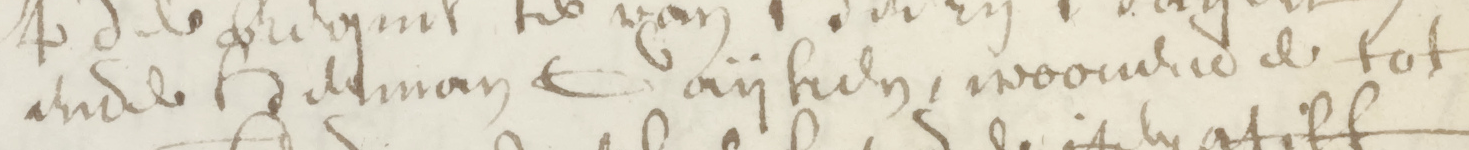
ende Herman Gaijken, woonende tot
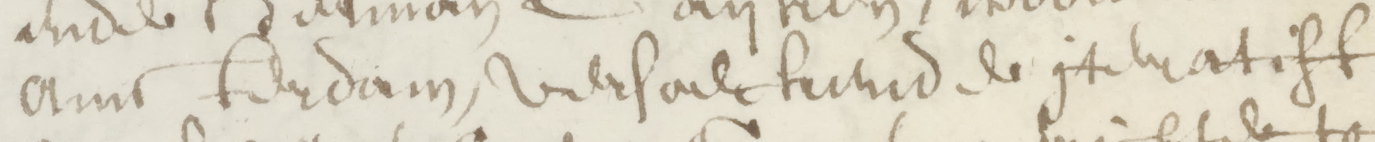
Amsterdam, versoeckende iteratiff
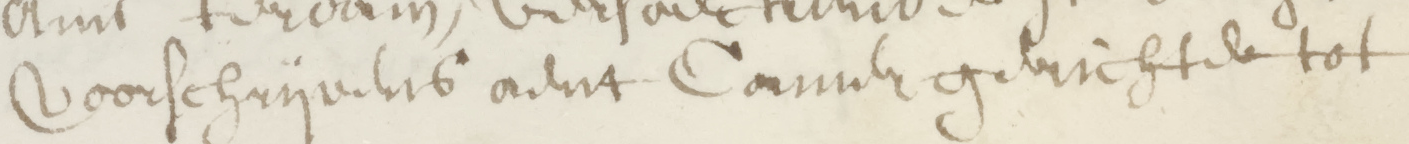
voorschrijvens aent Camergerichte tot
